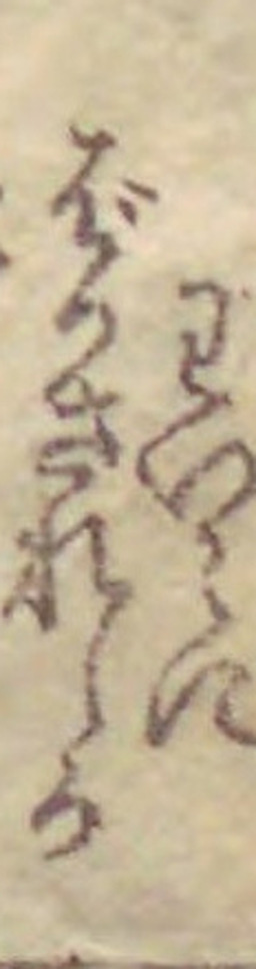ばかされしか
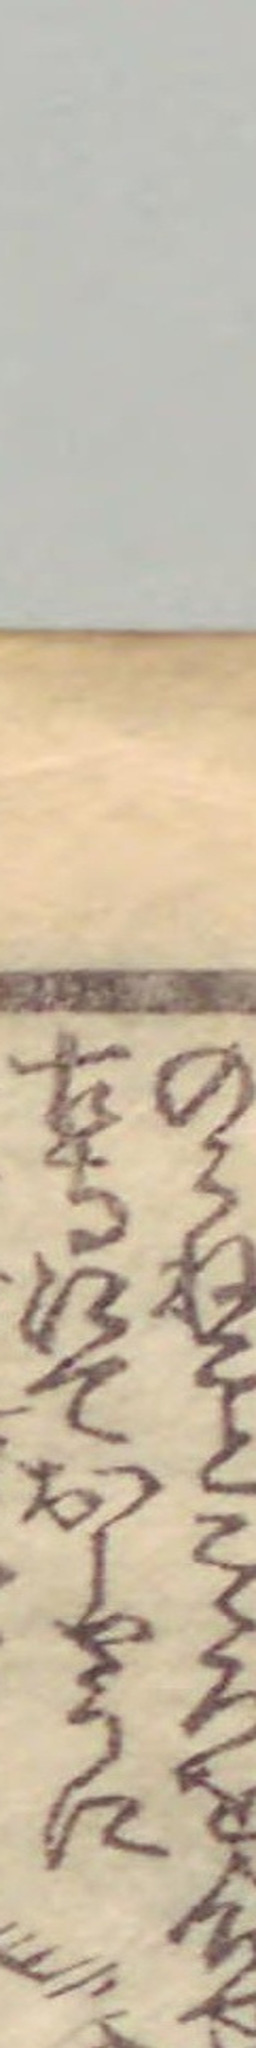古寺にておしやうに
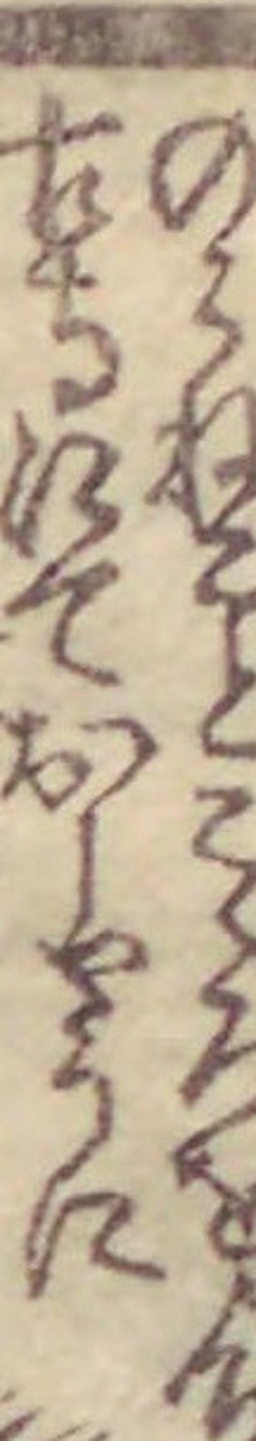古寺にておしやうに
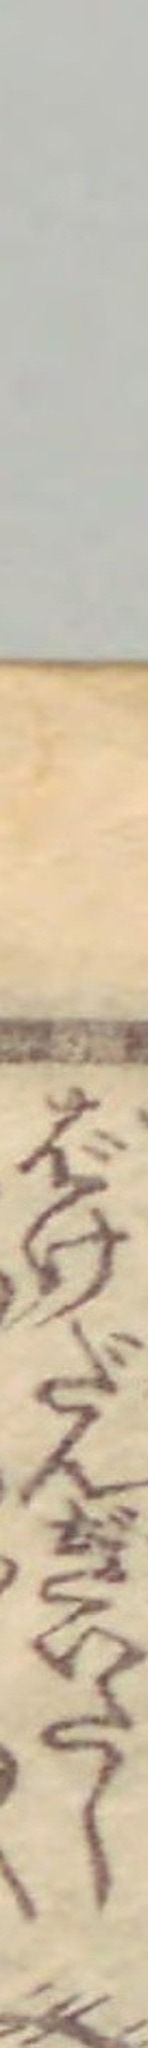ばけだんぎいたし
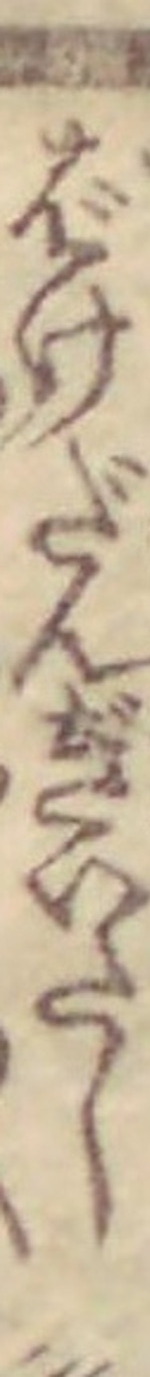ばけだんぎいたし
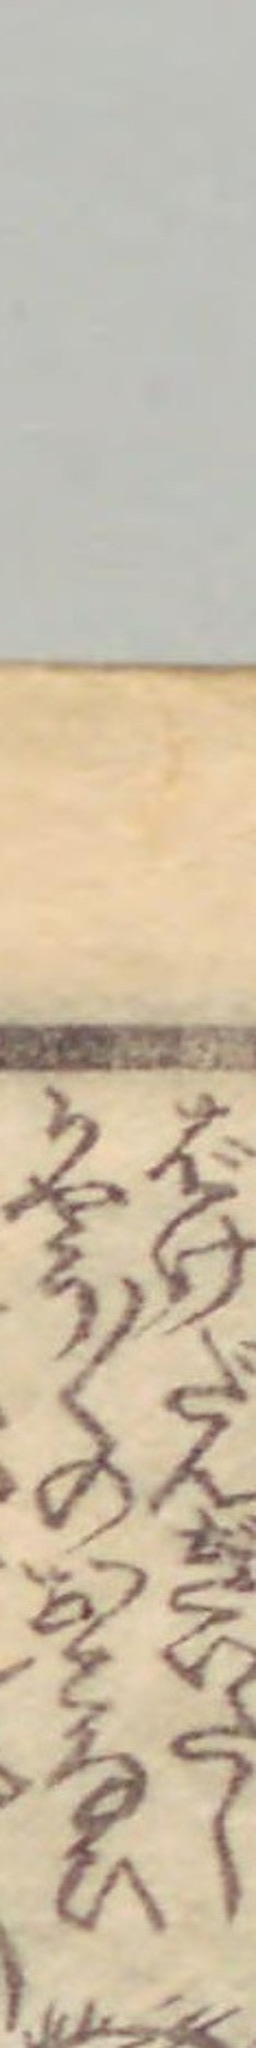かやう〳〵のおこなひ
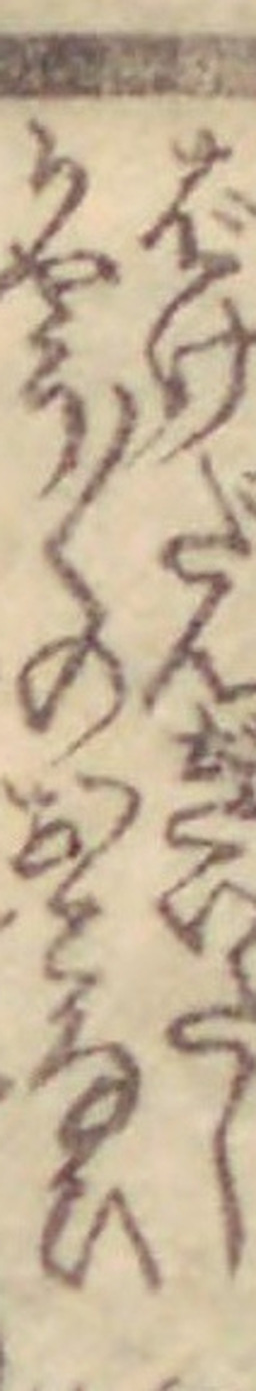かやう〳〵のおこなひ
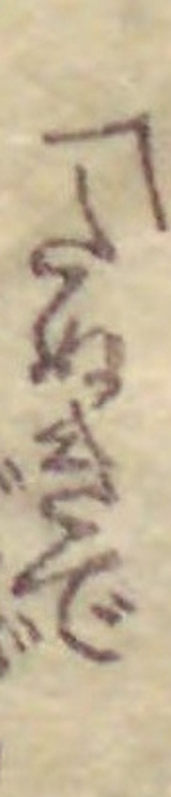〽たぬきで
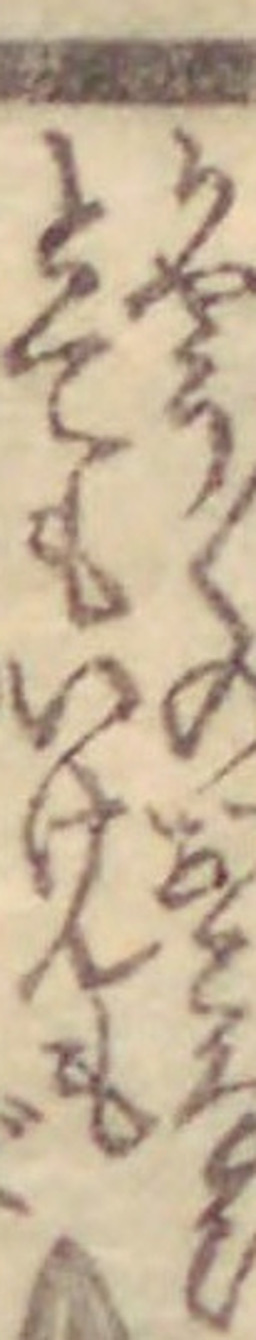とてもいけんも
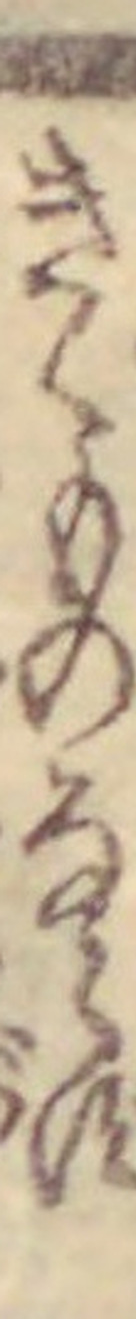きくものならず
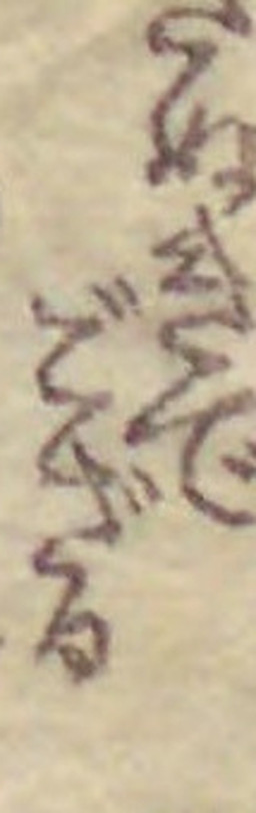ござる
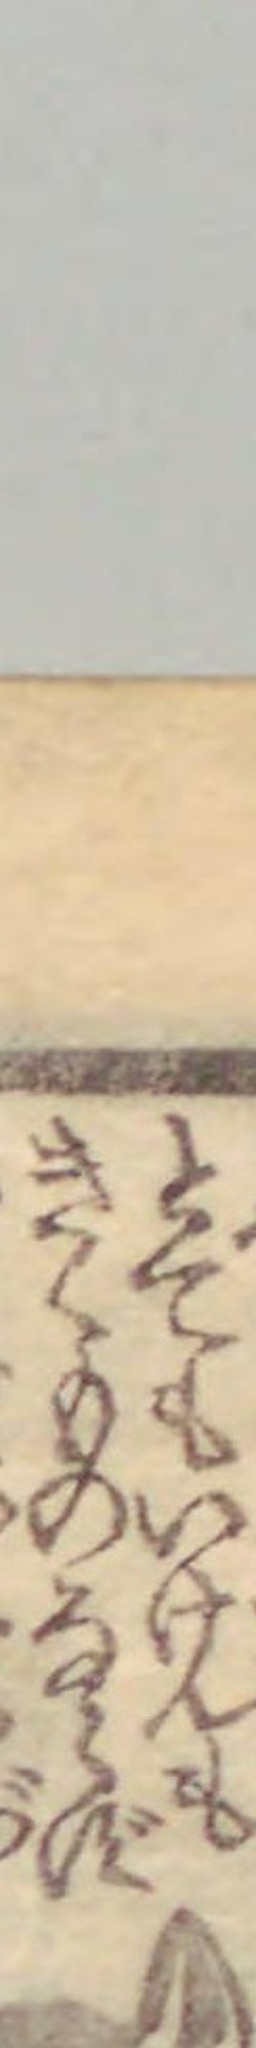きくものならず
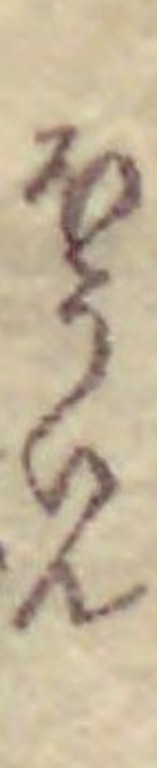ほういん
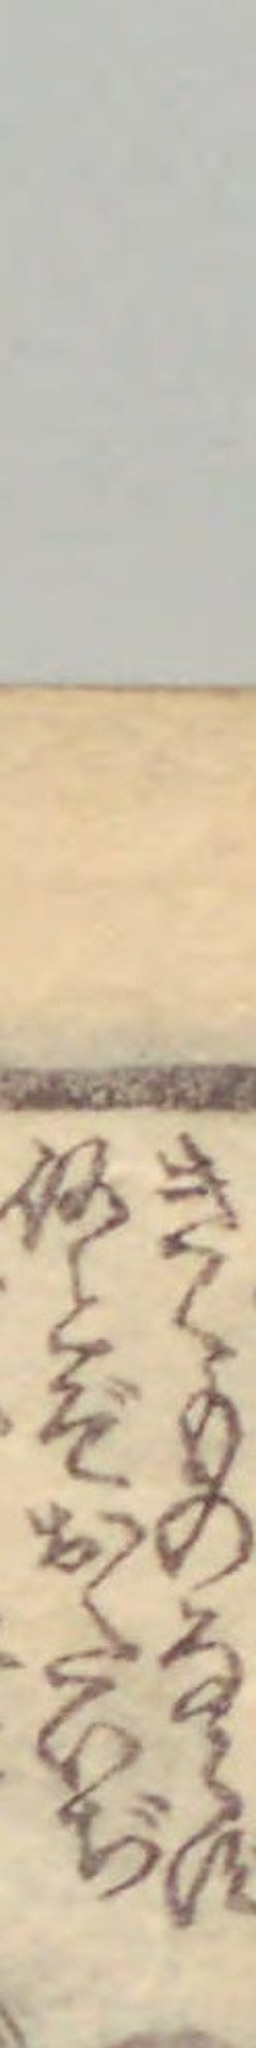何とぞおたいぢ
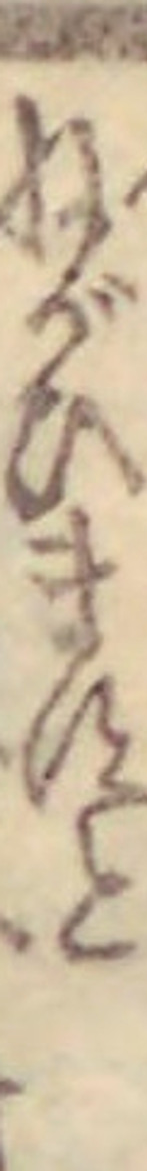ねがひますと
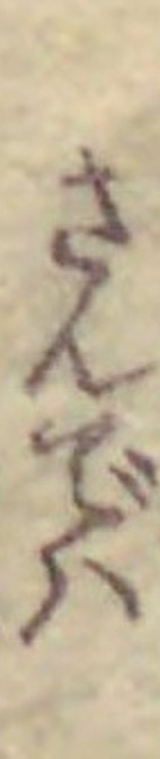さんでは
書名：化物世帯氣質
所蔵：国立国会図書館 National Diet Library, JAPAN
